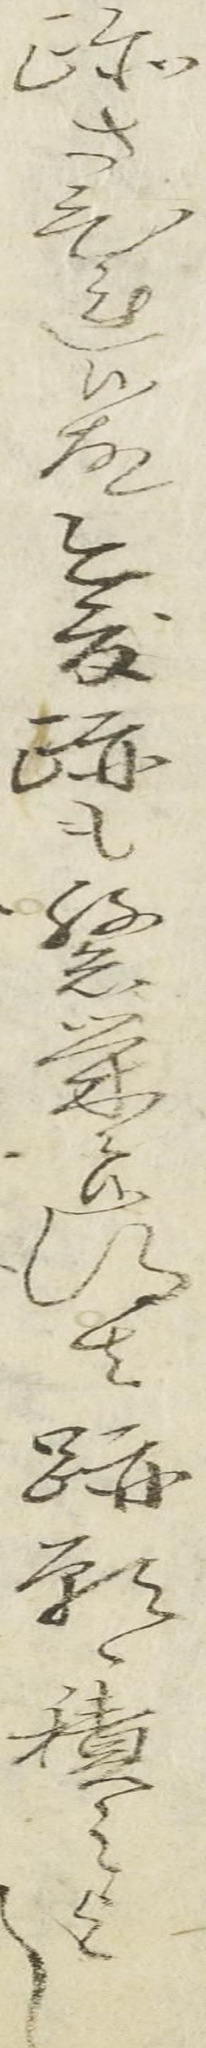跡さびれ候故今度跡も繁栄ニ候得は跡願候積之よし
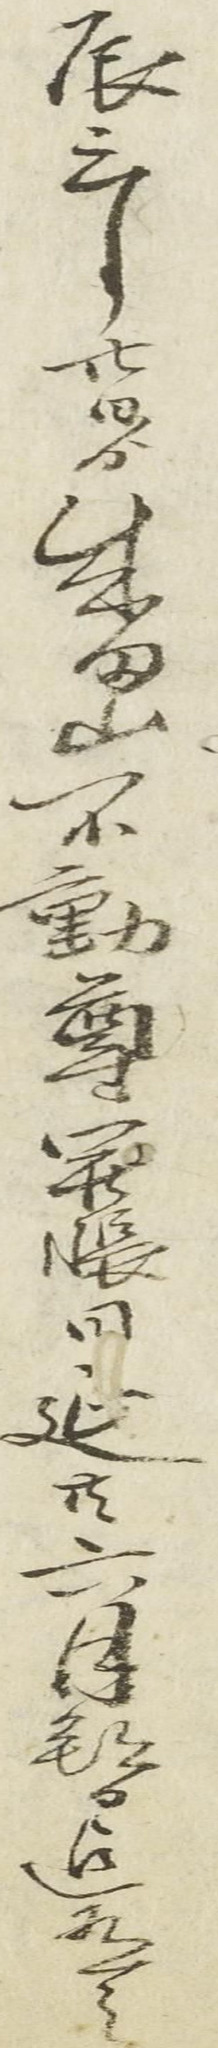辰三月廿日ゟ成田山不動尊開帳日延共六月朔日迄有之
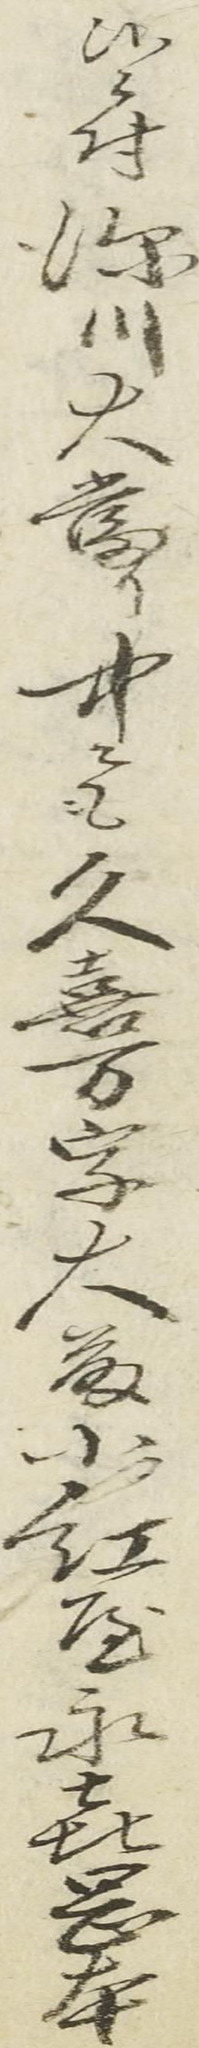候ニ付深川大当中ニも久喜万字大藤小紅屋永喜岡本
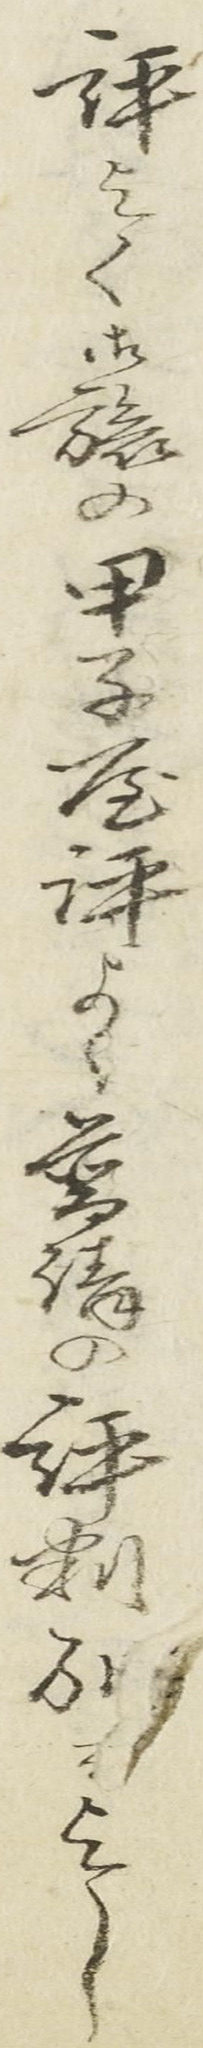評よく御旅の甲子屋評よく普請の評判別而よし
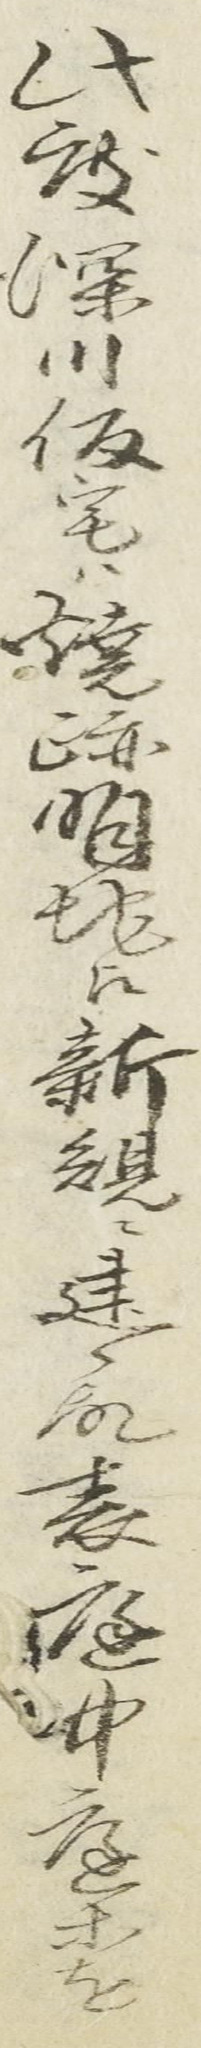此度深川仮宅ハ焼跡明地え新規ニ建候故表庭中庭等を
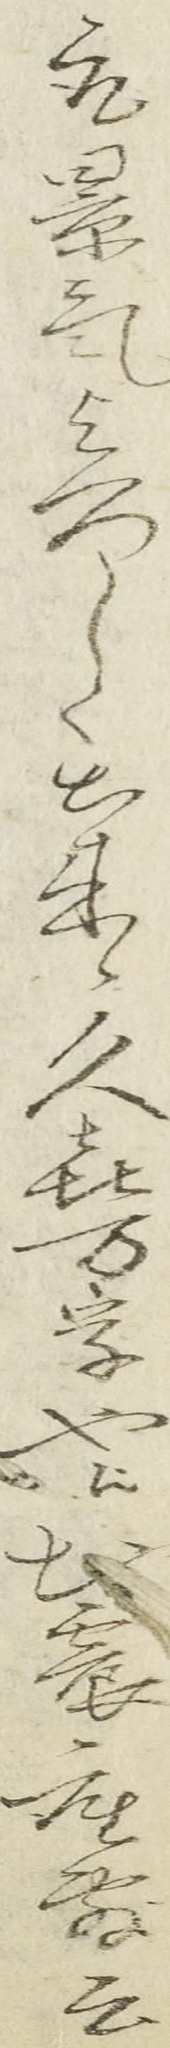取景気よろしく出来候久喜万字やえ地震座敷云
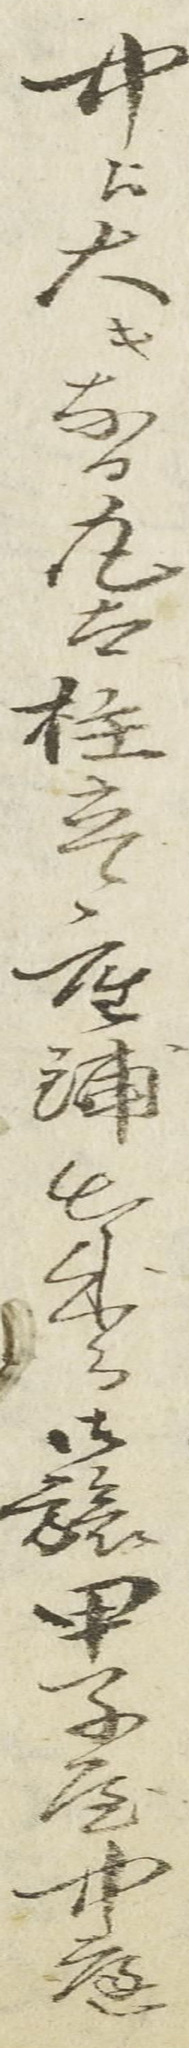中え大キなる丸太柱立候座鋪出来る御旅甲子屋中庭
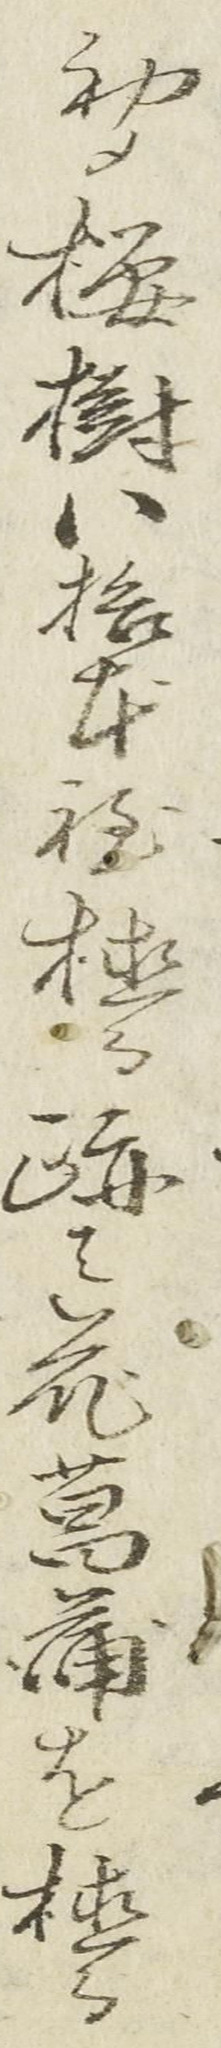初メ桜樹八拾本程植る跡は花菖蒲を植る
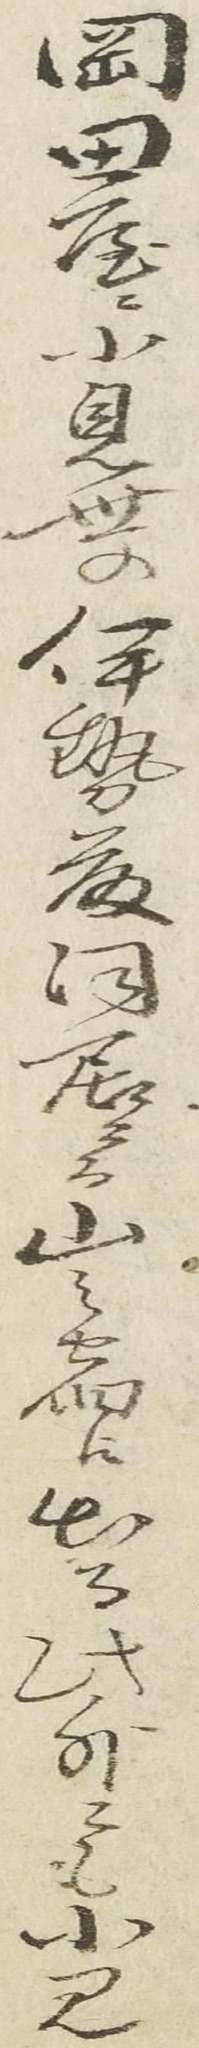岡田屋二小見世の伊勢藤同居ニ而山之宿え出る此外二も小見
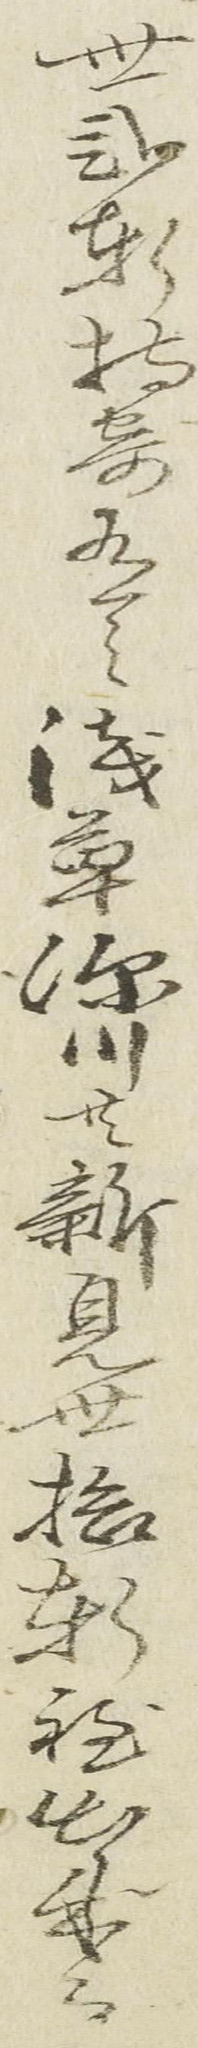世弐軒持寄有之浅草深川共新見世拾軒程出来る
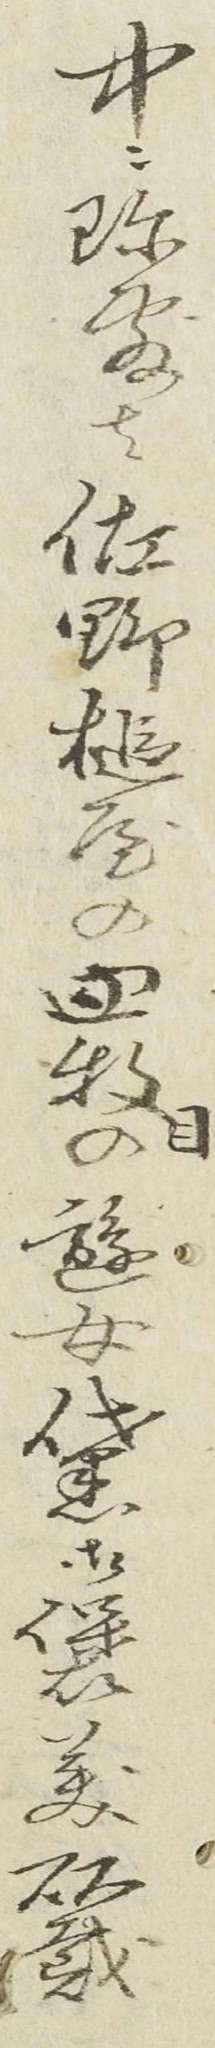中二珍敷は佐野槌屋の四枚目の遊女黛御褒美頂戴
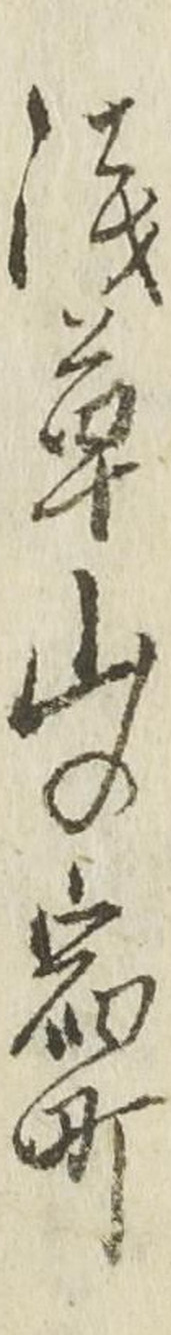浅草山の宿町
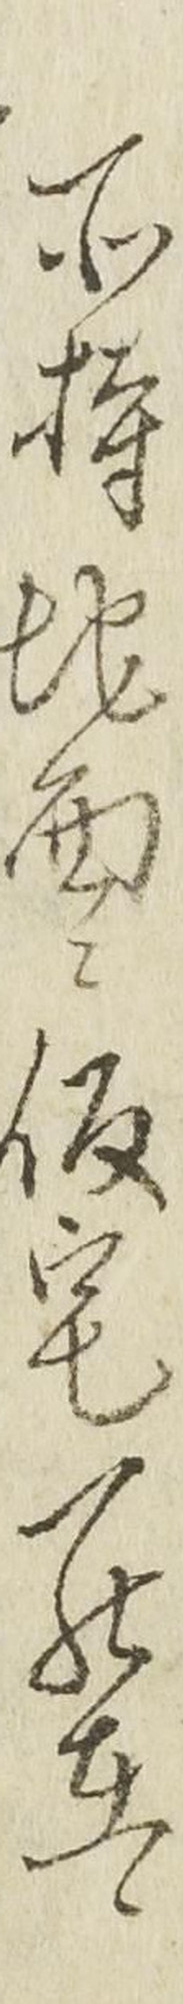所持地面ニ仮宅罷在候
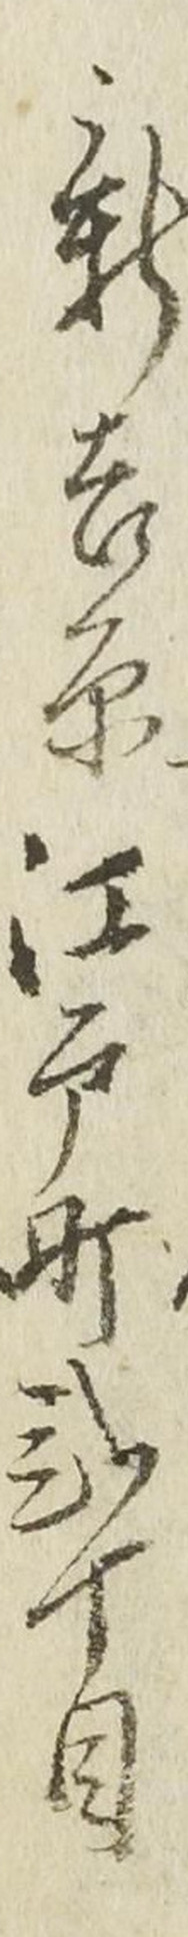新吉原江戸町弐丁目
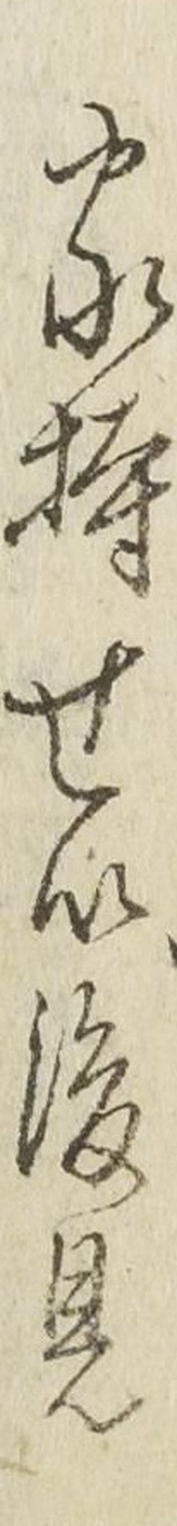家持せい後見
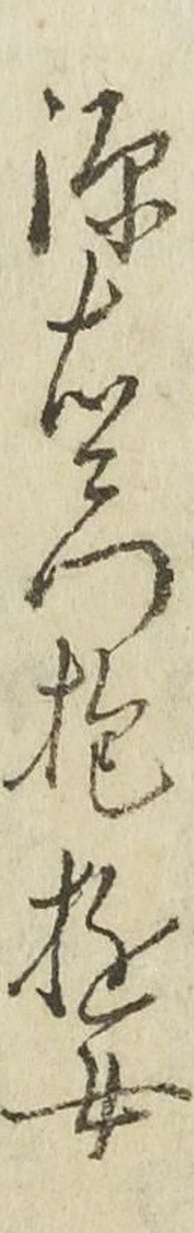源右衛門抱遊女
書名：安政二乙卯年十月二日大地震之事
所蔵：東京大学地震研究所図書室 Earthquake Research Institute Library, The University of Tokyo, JAPAN
